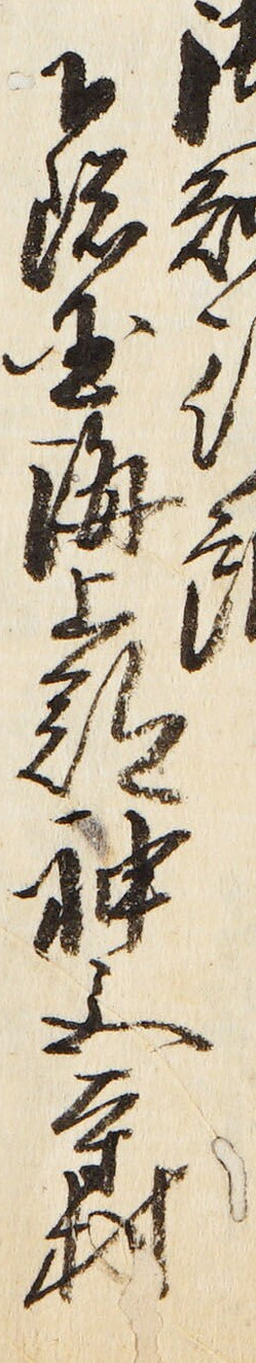下総国海上郡神宮寺村
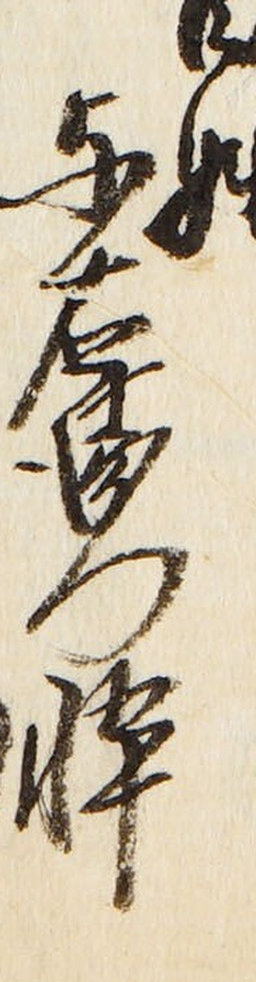与右衛門忰
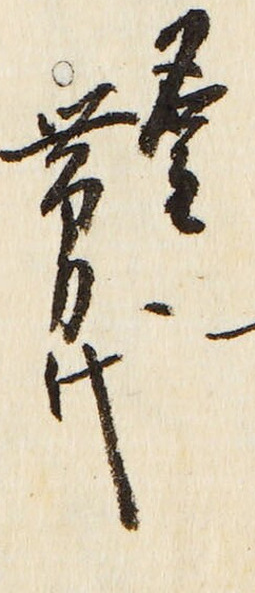帯刀代
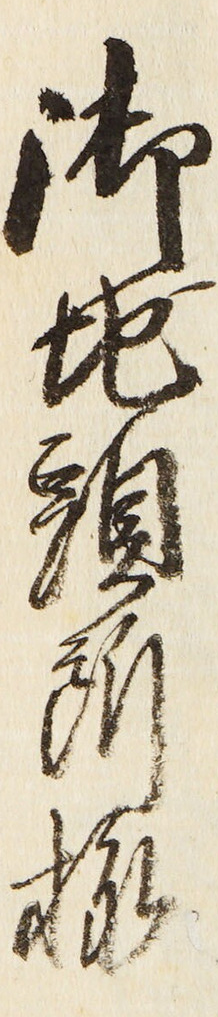御地頭所様
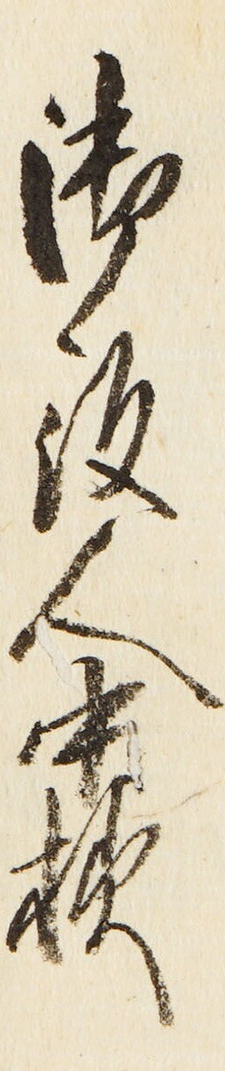御役人中様

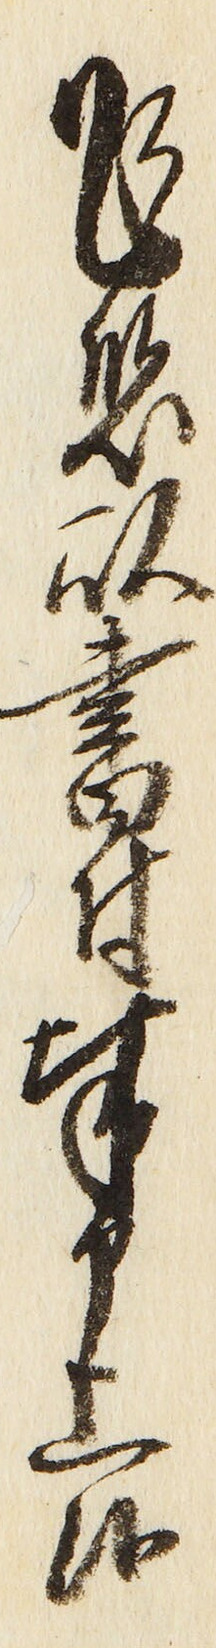乍恐意以書付奉申上候
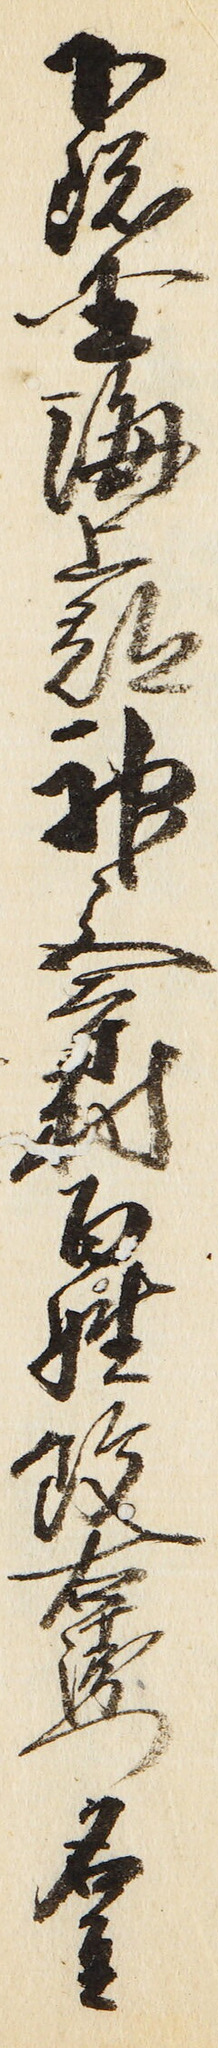一下総国海上郡神宮寺村百姓政右衛門名主
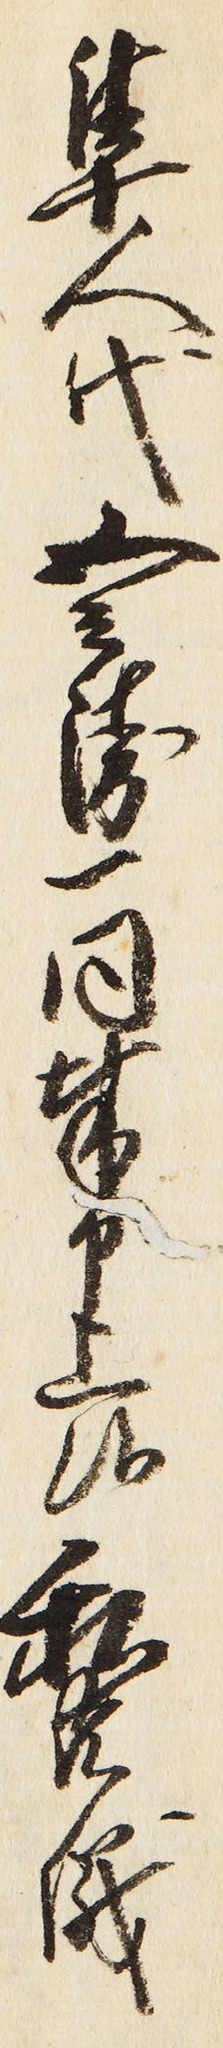隼人代五兵衛一同奉申上候私共儀
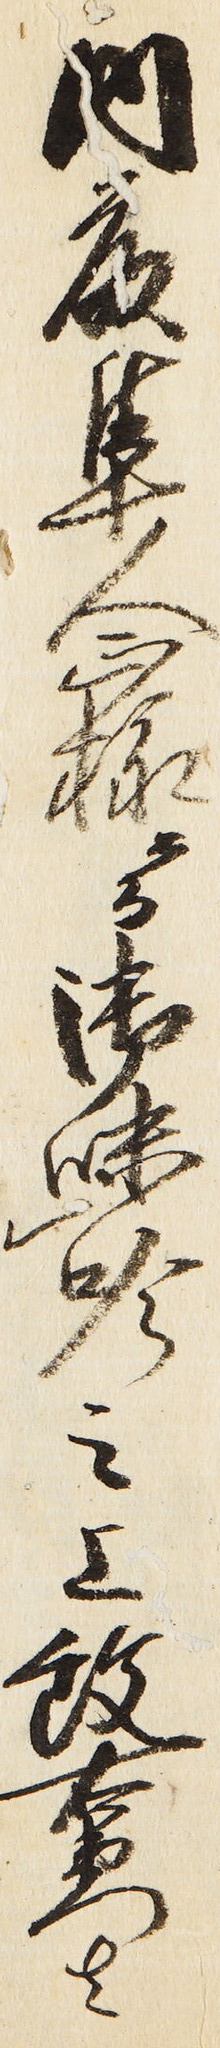内藤隼人正様ニ而御味吟之上政右衛門者
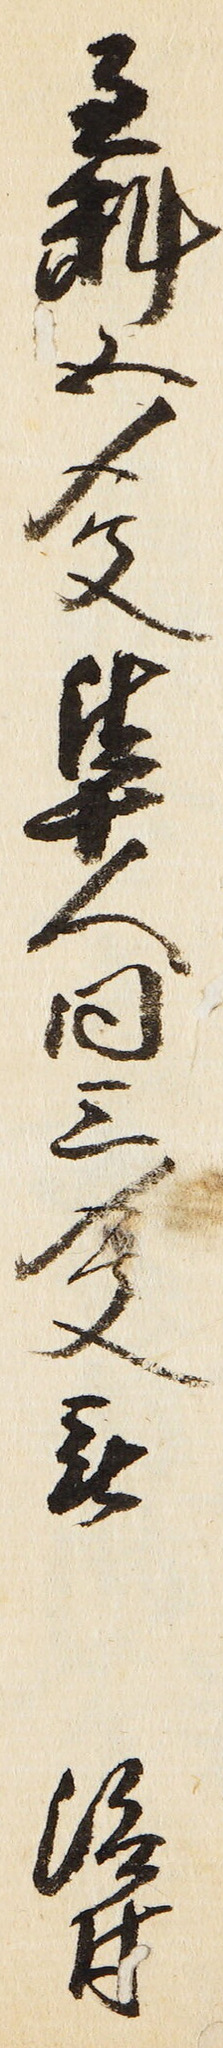過料五貫文隼人同三貫文被仰付
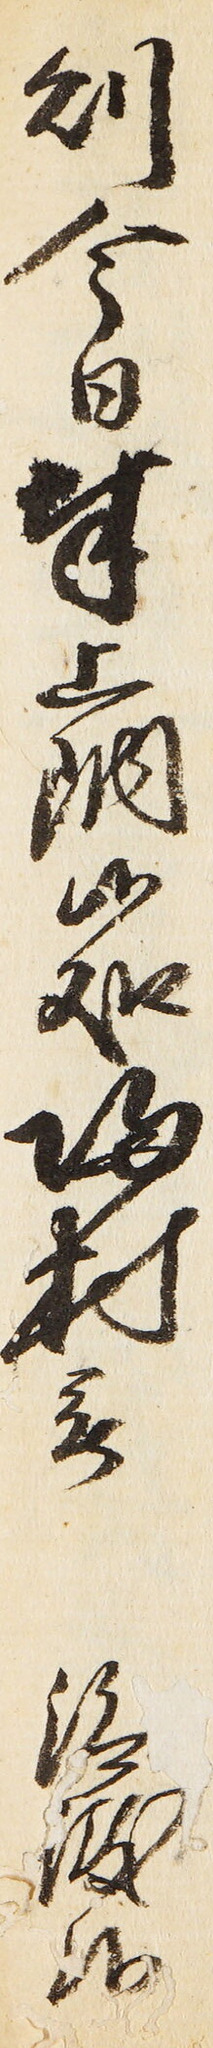則今日奉上納候処帰村被仰渡候
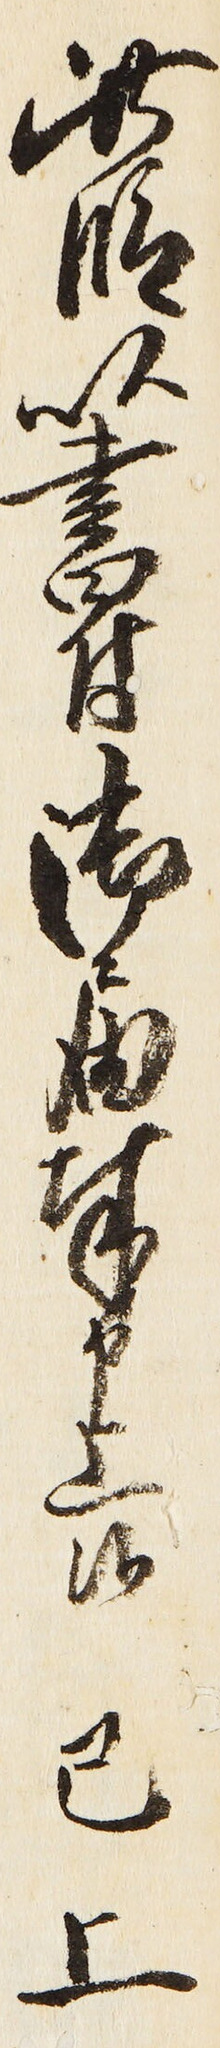此段以書付御届奉申上候已上
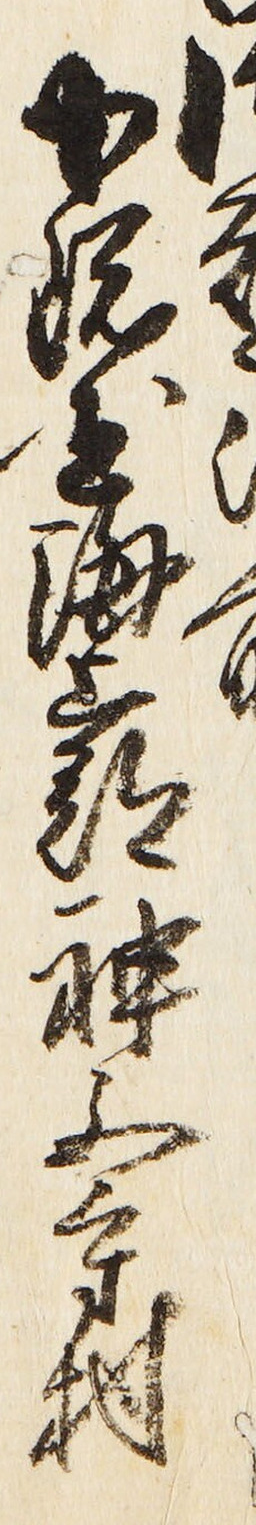下総国海上郡神宮寺村
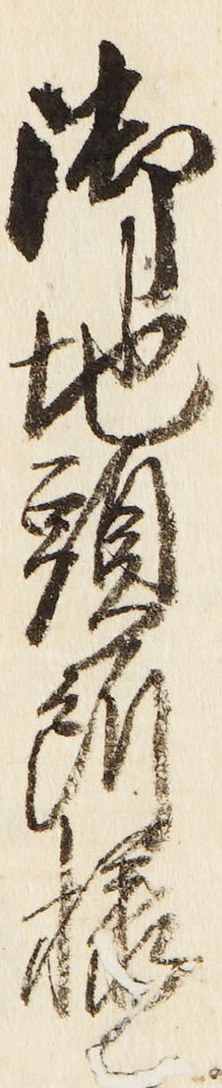御地頭所様
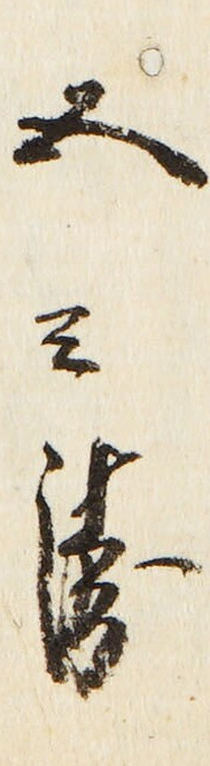五兵衛
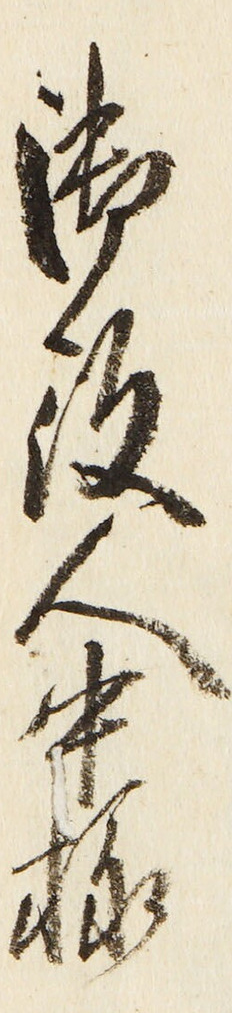御役人中様
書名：難船一件記録
